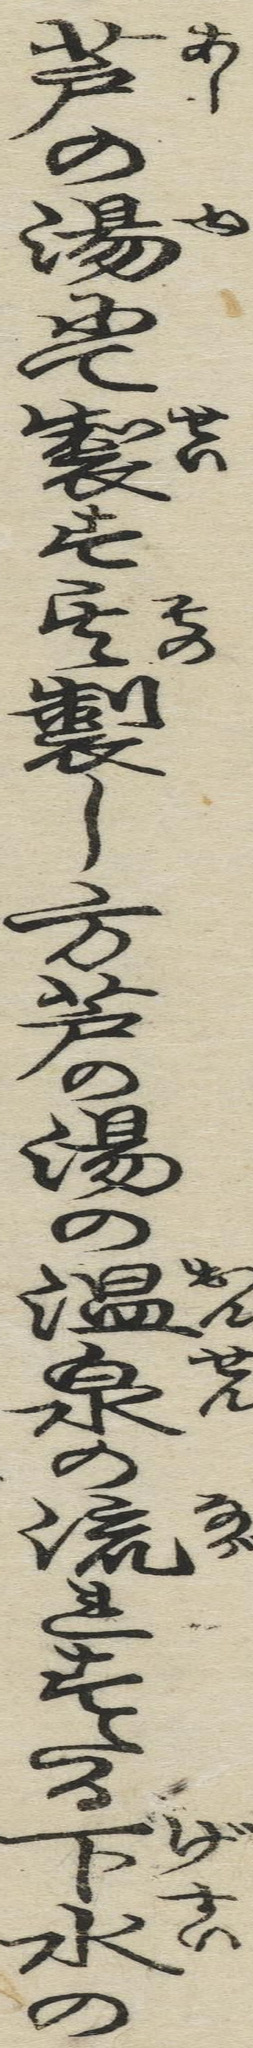芦の湯にて製す其製し方芦の湯温泉の流れすたる下水の
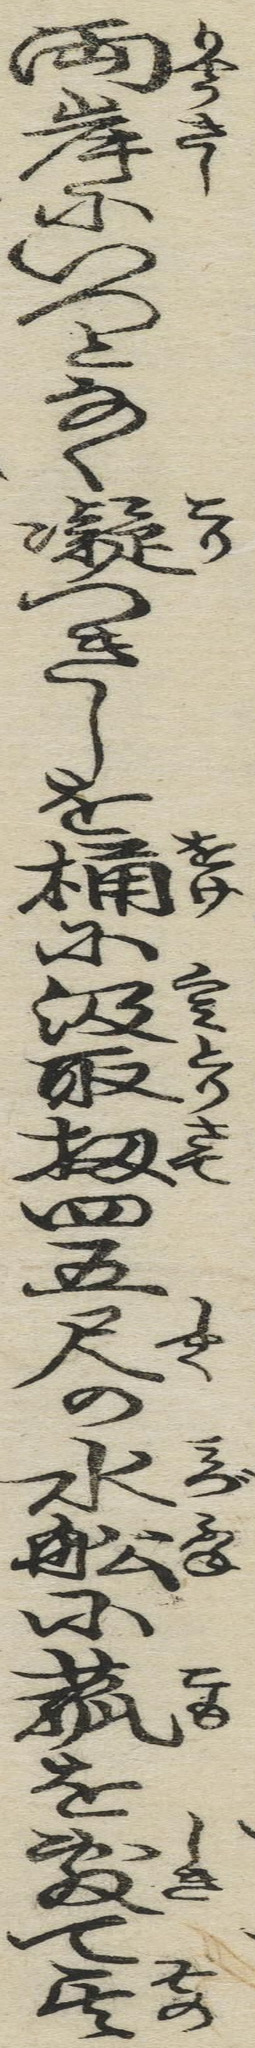両岸にいつとなく凝つきしを桶に汲取扨四五尺の水船に菰を敷て其
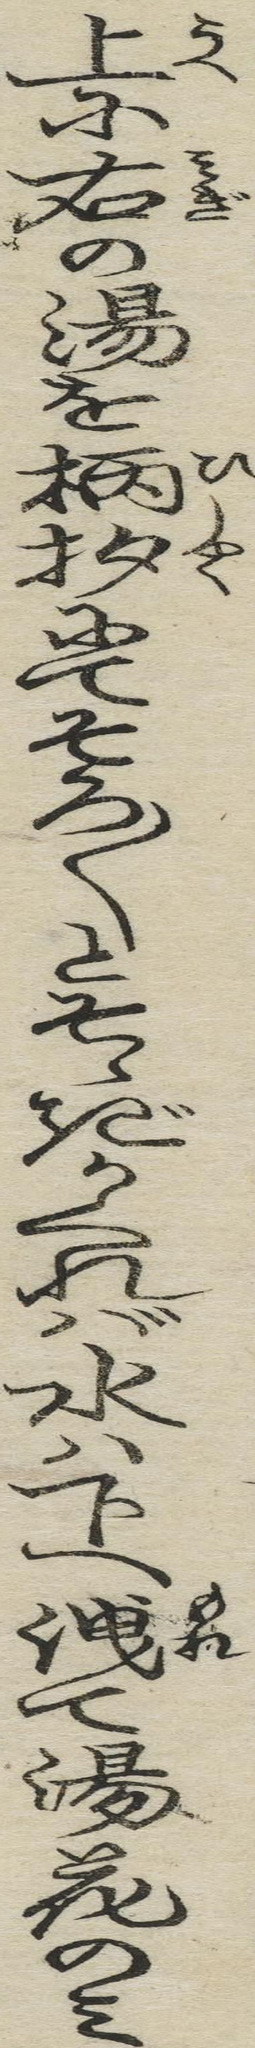上に右の湯を柄杓にてそろ〳〵とそゝぎかくれば水は下へ洩て湯花のみ
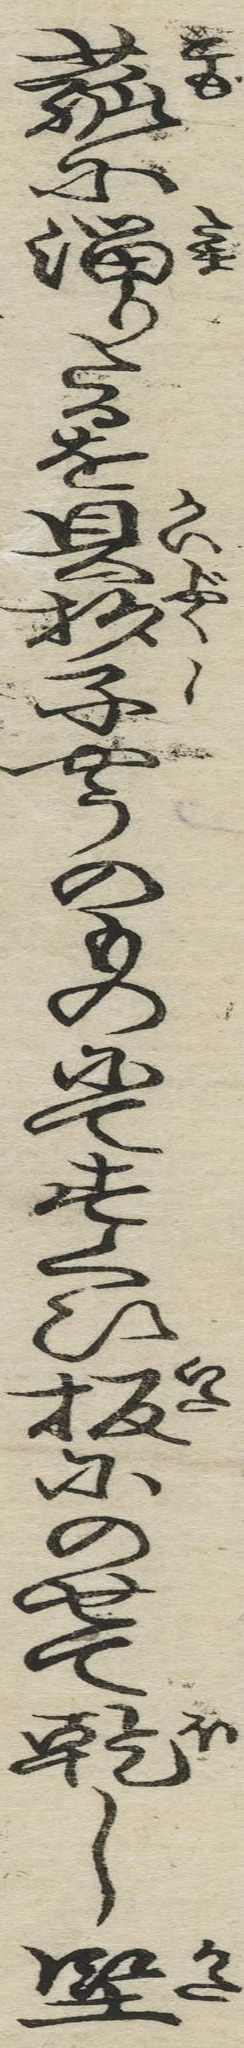菰に溜りたるを貝杓子やうのものにてすくひ板にのせて乾し堅
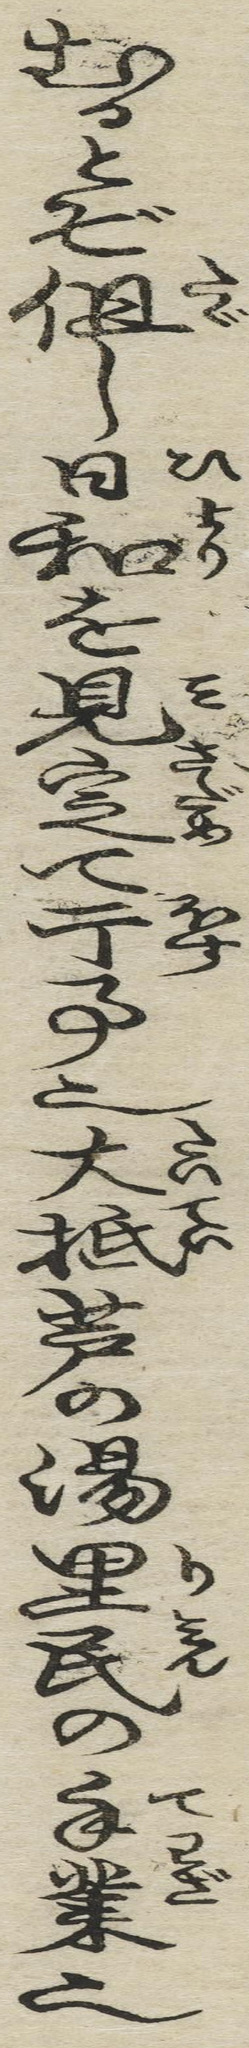むるとぞ但し日和を見定て干事也大抵芦の湯里民の手業也
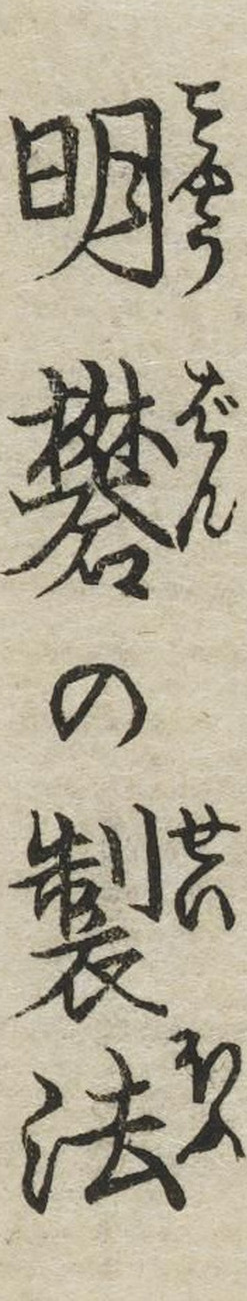明礬の製法
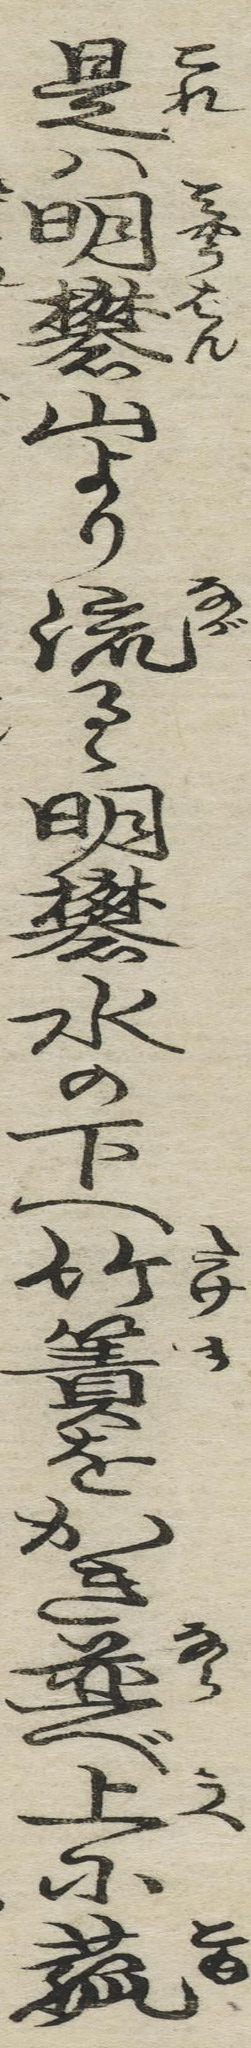是は明礬伊亜麻より流るゝ明礬水の下へ竹簀をかき並べ上に菰
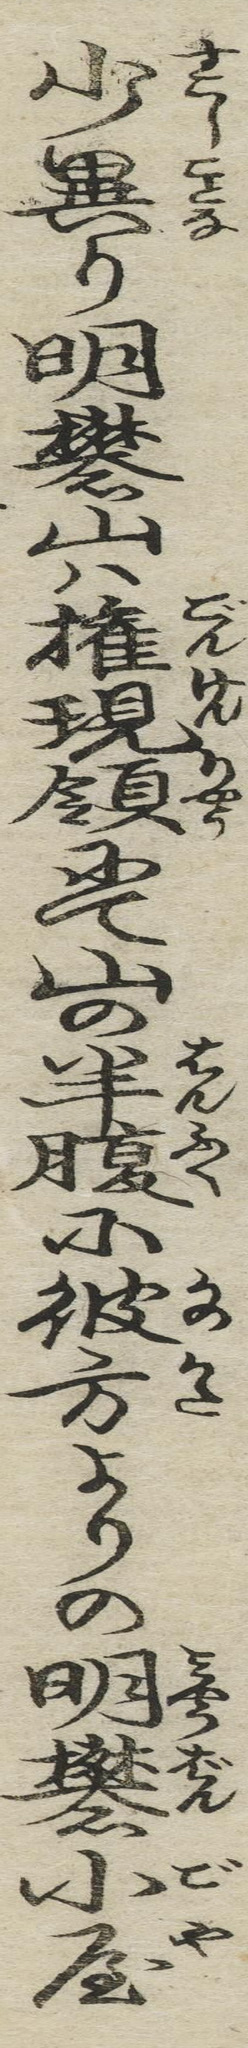少異り明礬山は権現領にて山の半腹に彼方よりの明礬小屋
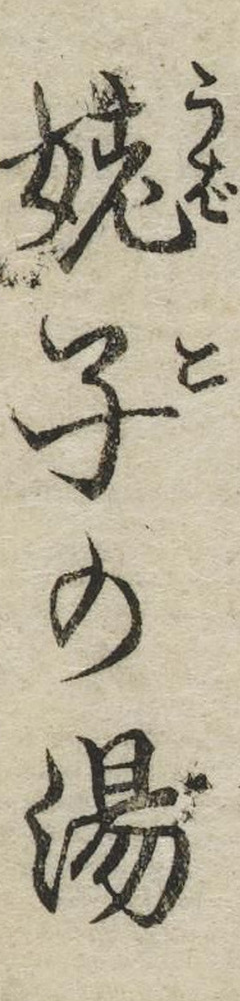姥小の湯
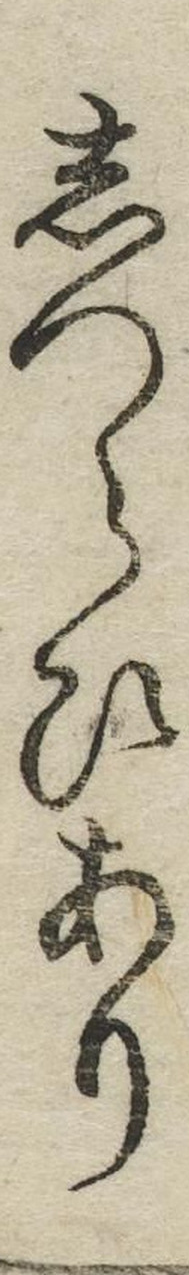しつらひあり

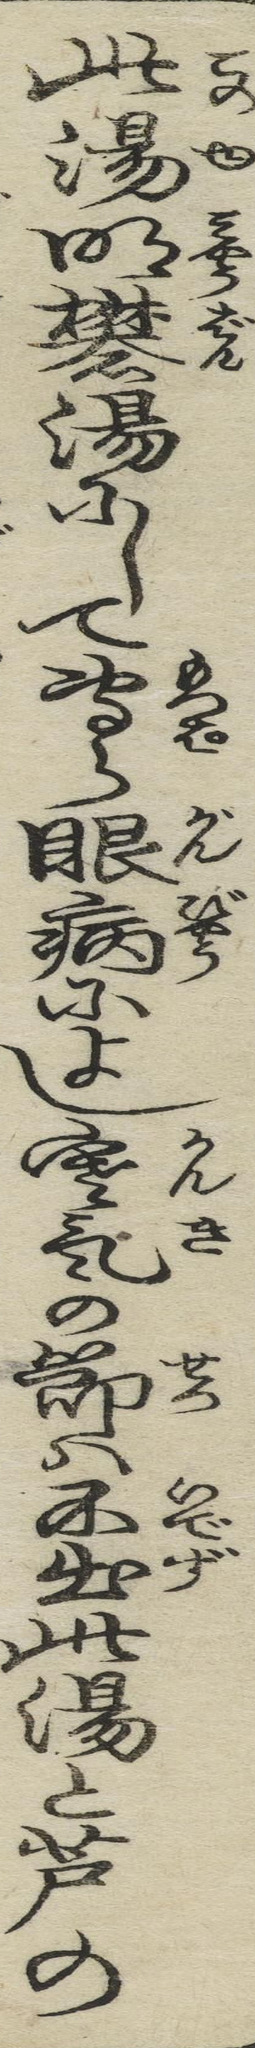此湯明礬湯にして専ら眼病によし雲気の節は不出此不と芦の
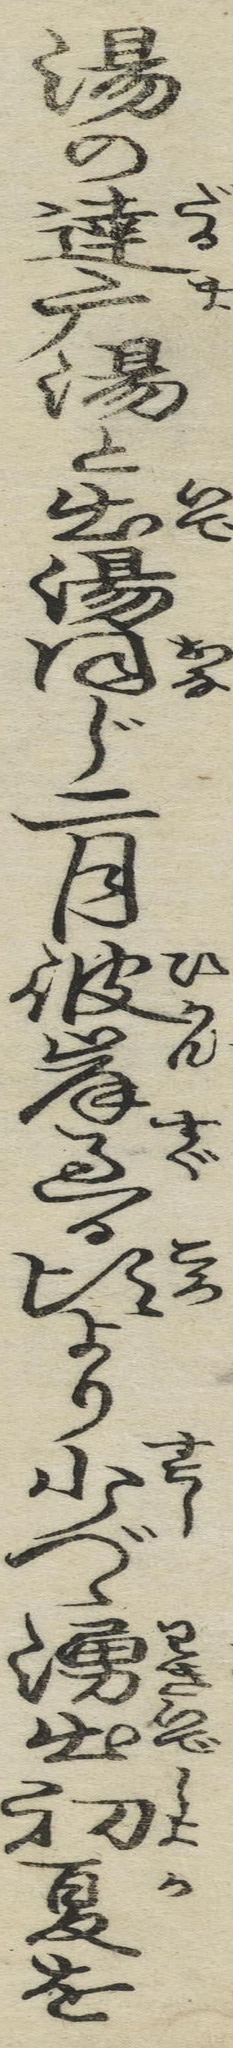湯の達广湯と出湯同じ二月彼岸過る頃より少づゝ湧出初夏を
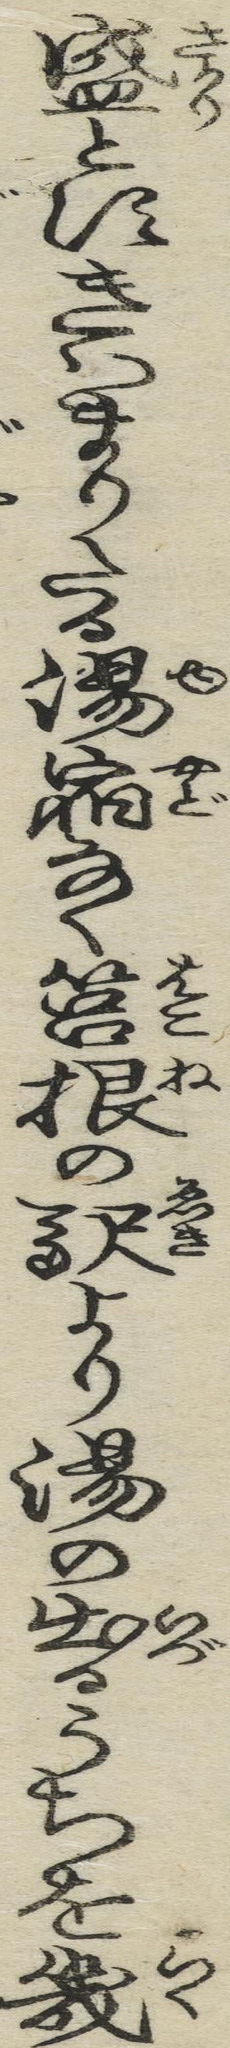盛とすきはまりたる湯宿なく筥根の駅より湯の出るうちを幾
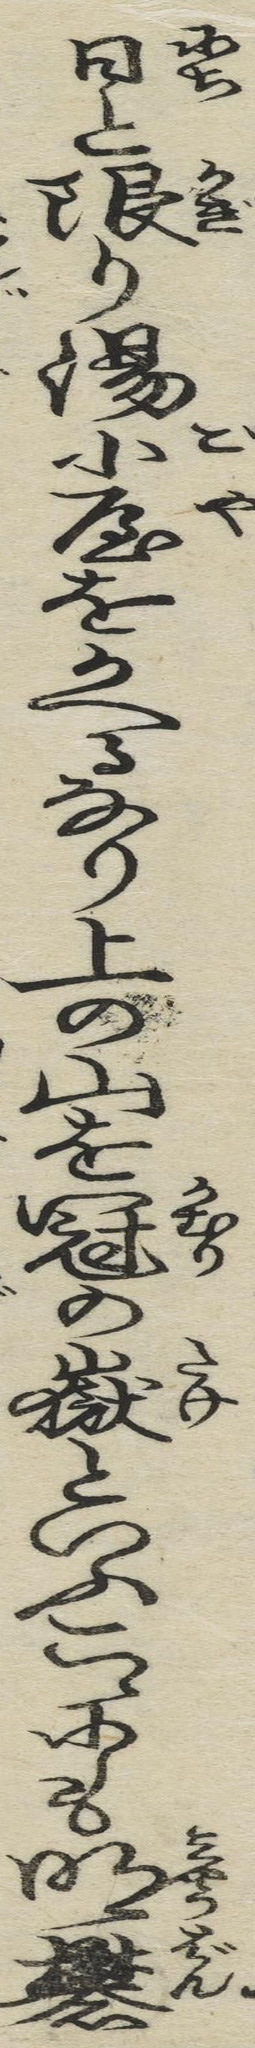日と限り湯小屋をかへるなり上の山を冠の嶽といふこゝにも明礬
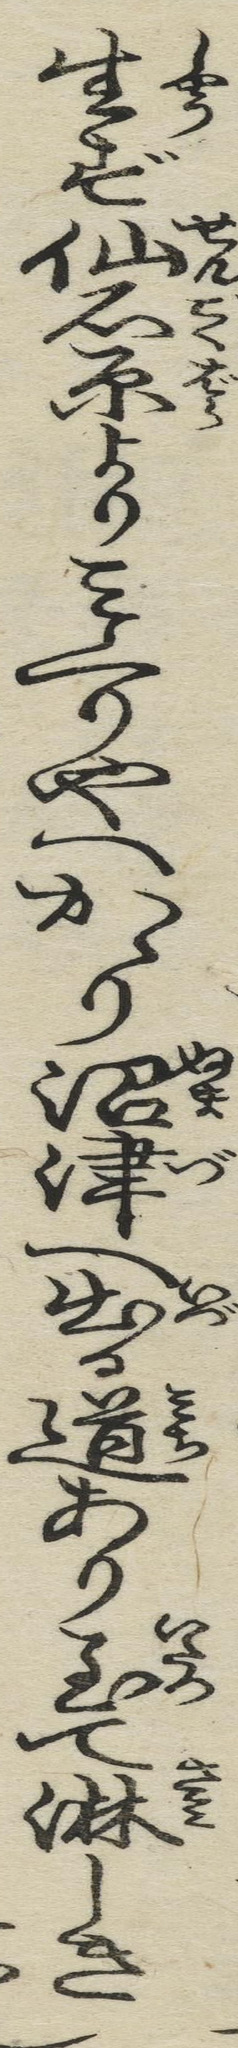生ず仙石原よりみくりやへかゝり沼津へ出る道あり至て淋しき
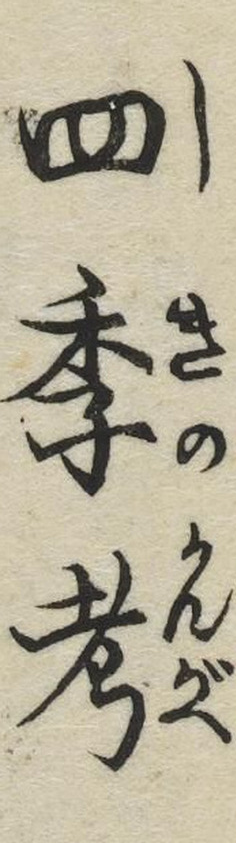四季考
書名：箱根七湯　温泉圖會　全
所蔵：東京大学地震研究所図書室 Earthquake Research Institute Library, The University of Tokyo, JAPAN
